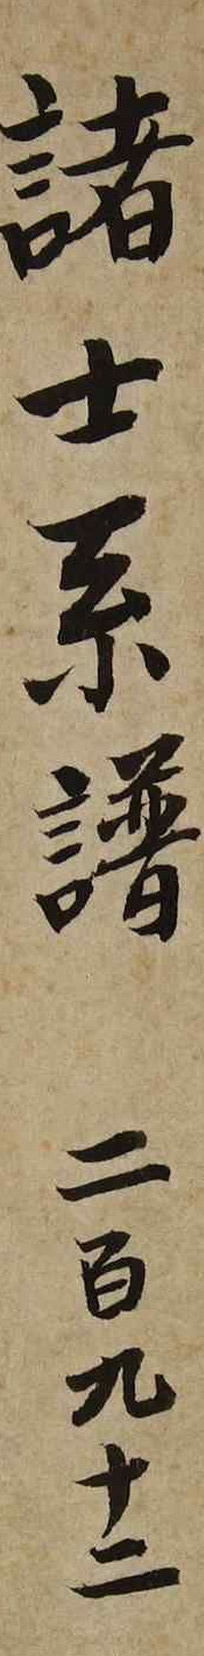諸士系譜二百九十二

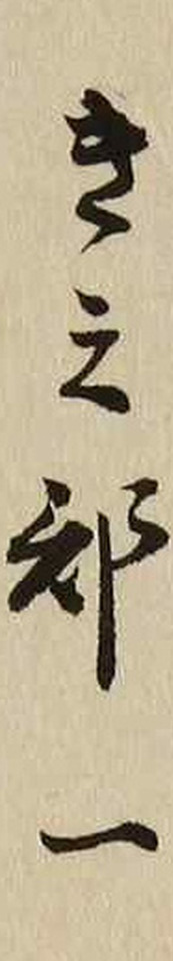き之部一
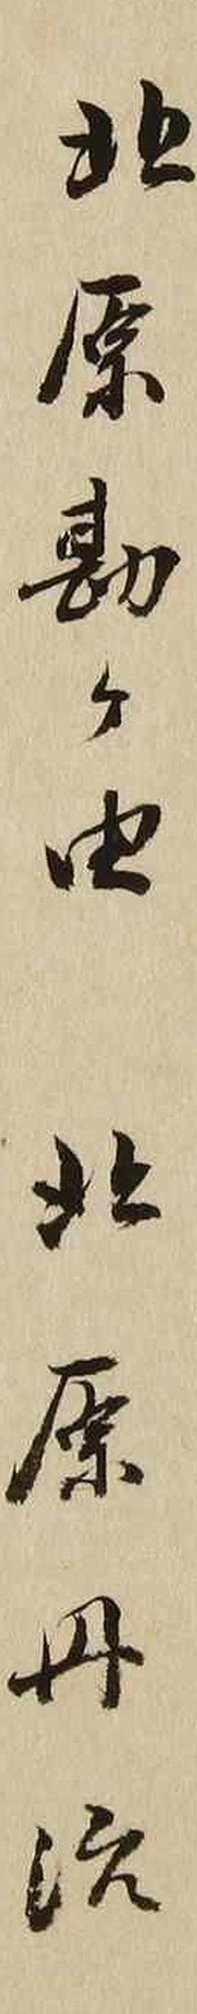北原勘解由北原丹治

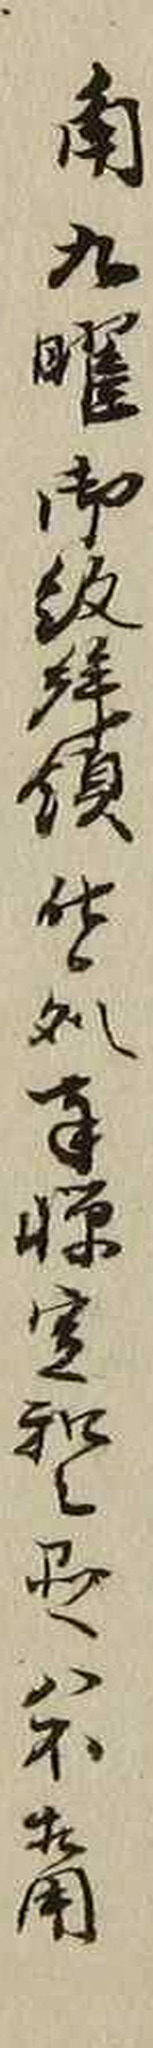南九曜御紋拝領仕候処奉師定和之品へは不相用
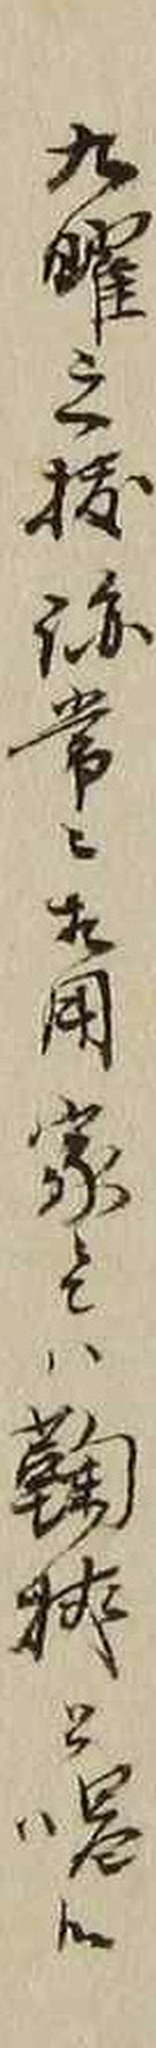九曜之抜跡常に相用家に而は鞠挟と唱候
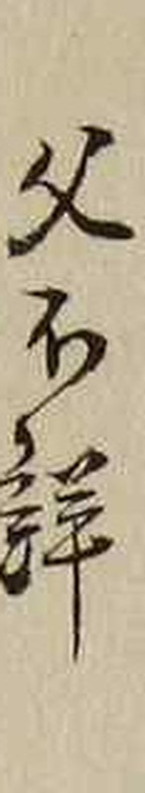父不詳
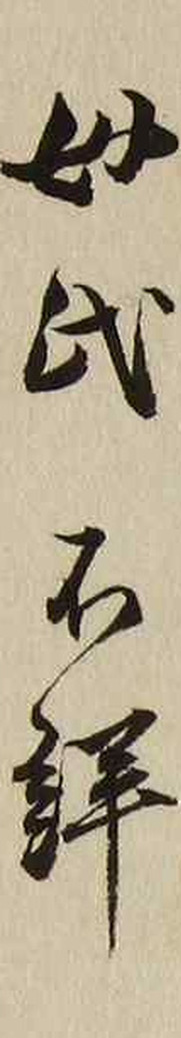母氏不詳
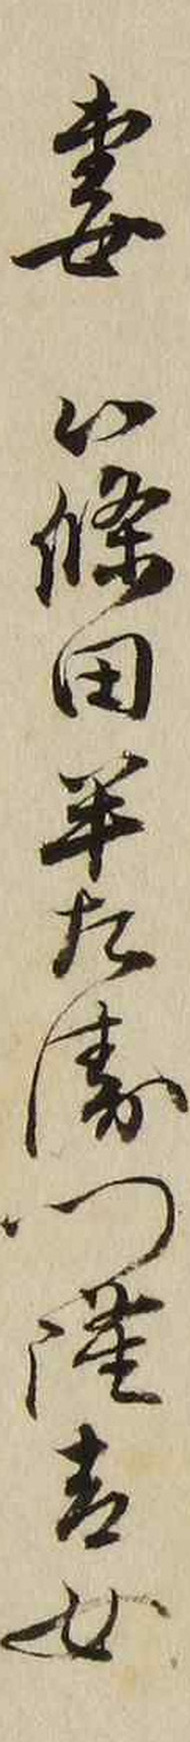妻篠田半左衛門陸吉女

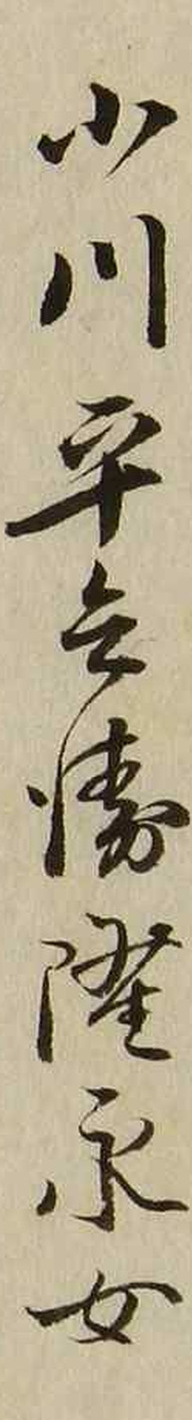小川平兵衛陸永女
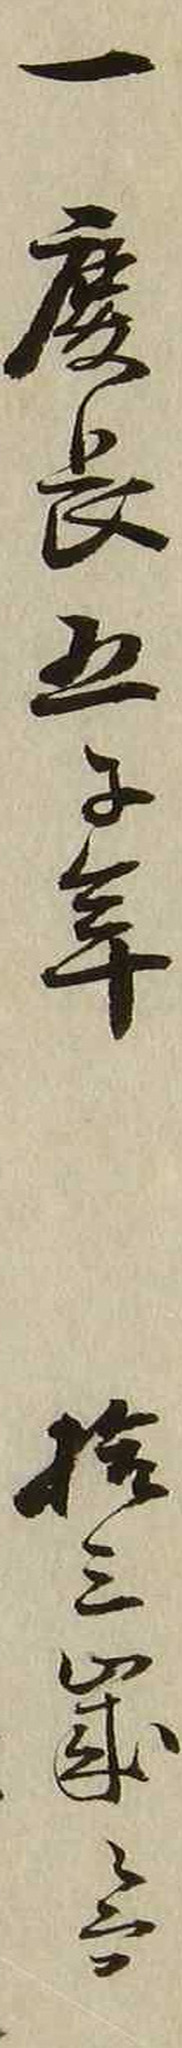一慶長五子年拾三歳に而
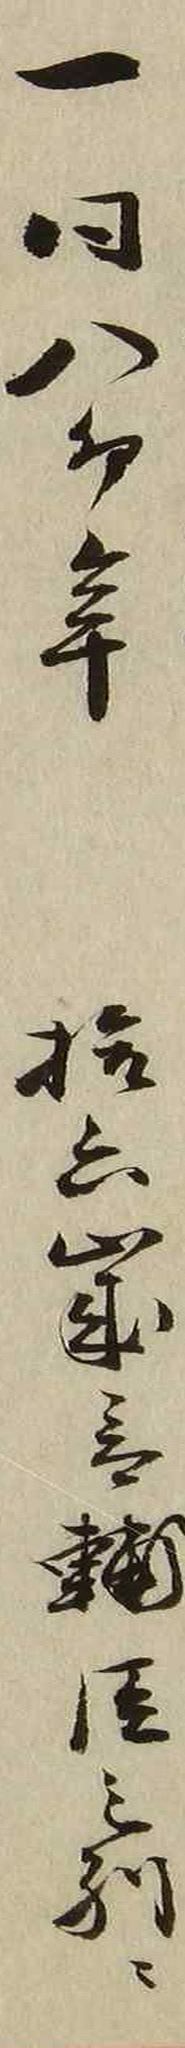一同八卯年拾六歳に而輔臣之列に
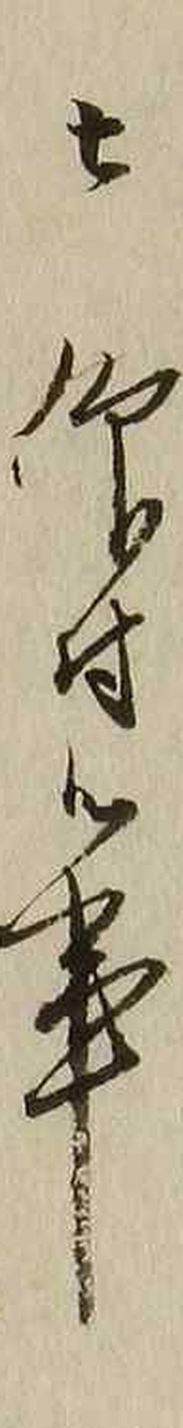被仰付候事
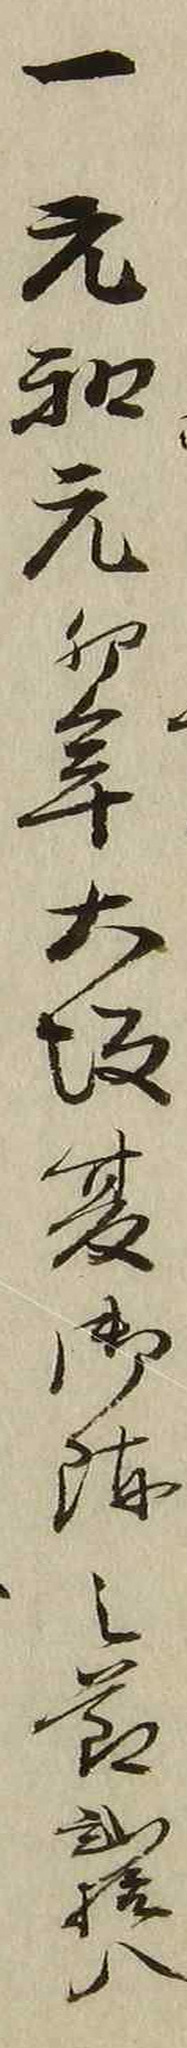一元和元卯年大坂夏御陣之節弐拾八
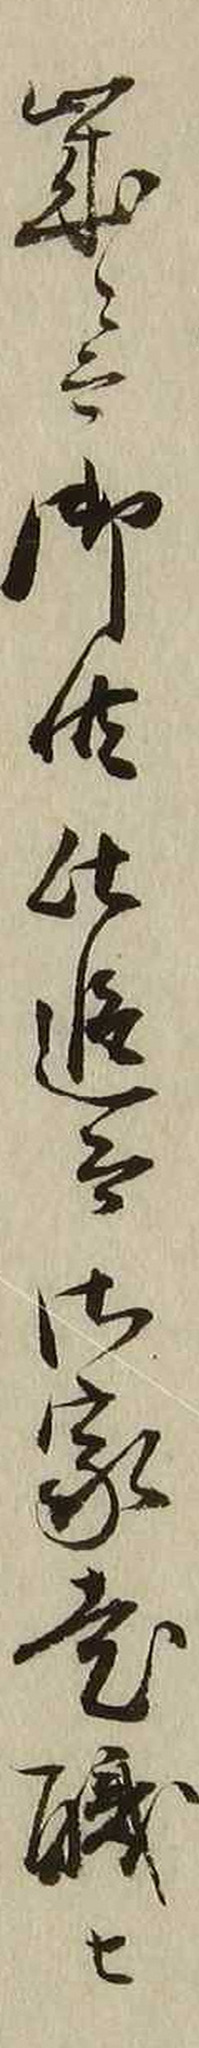歳に而御供仕追而御家老職被
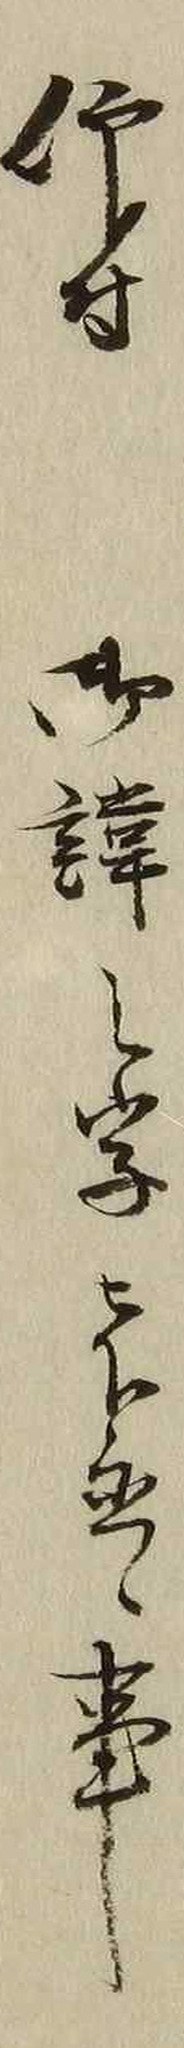仰付御諱之字被下置候事
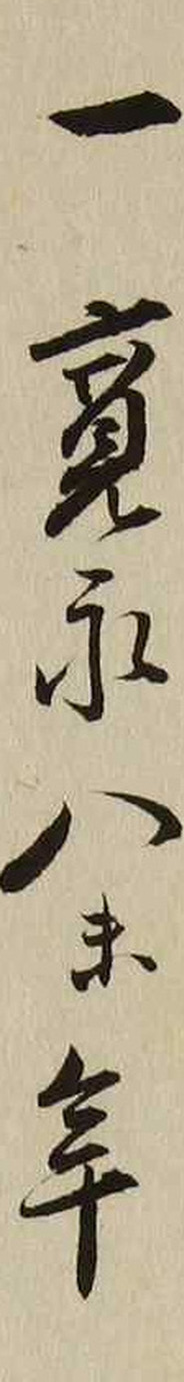一寛永八未年
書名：諸士系譜　巻之292　き之部1
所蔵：会津若松市立会津図書館
